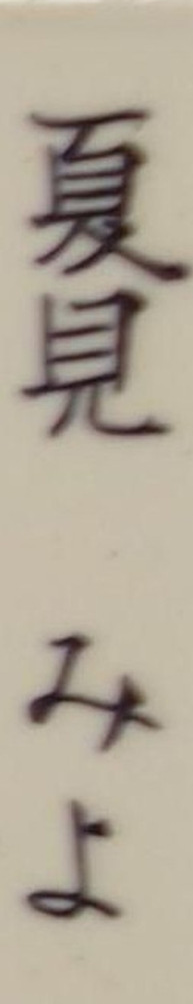夏見みよ
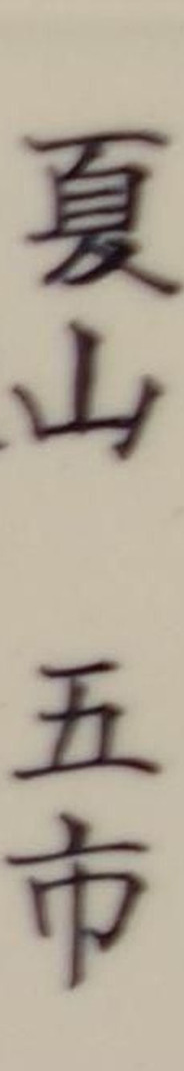夏山五市
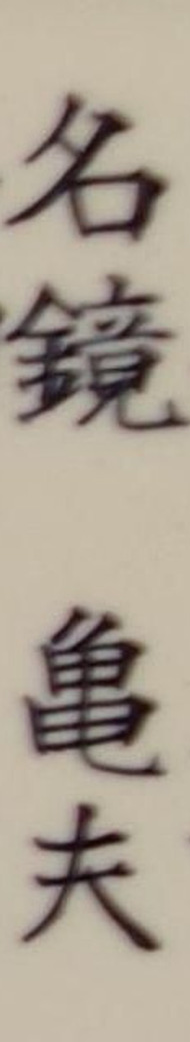名鏡亀夫
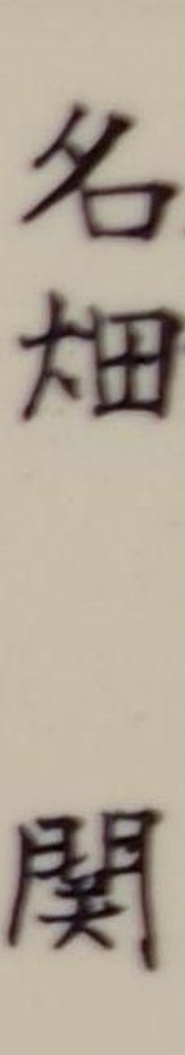名畑関
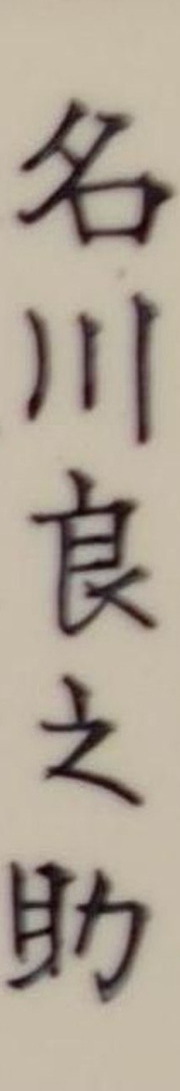名川良之助
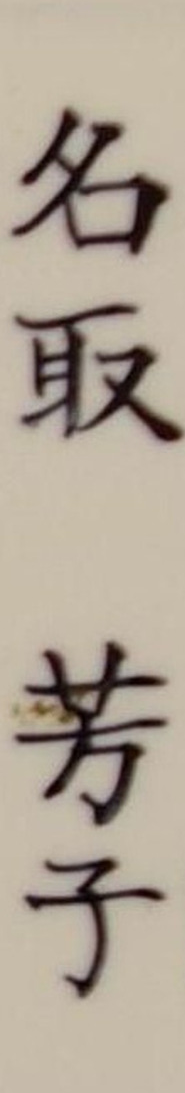名取芳子
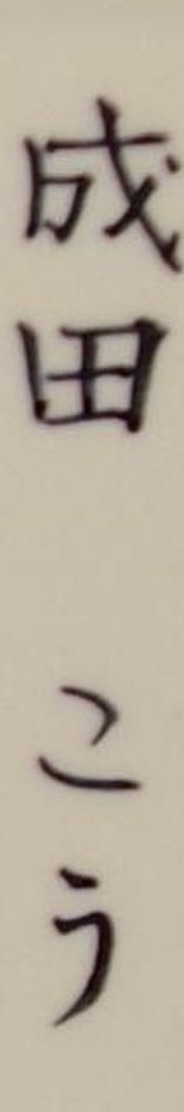成田こう
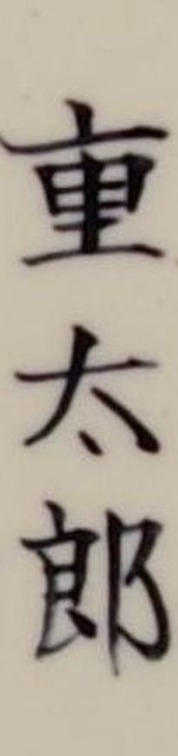重太郎
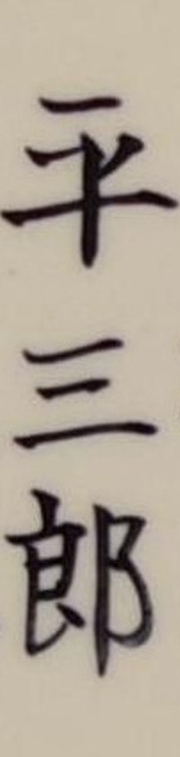平三郎
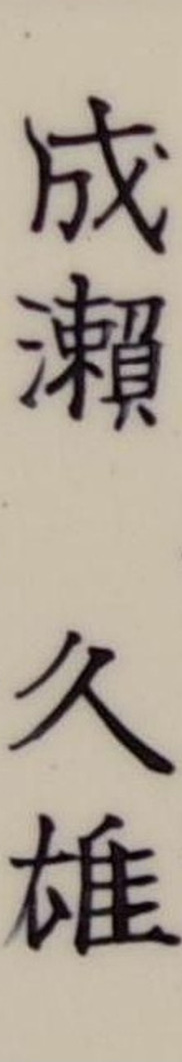成瀬久雄
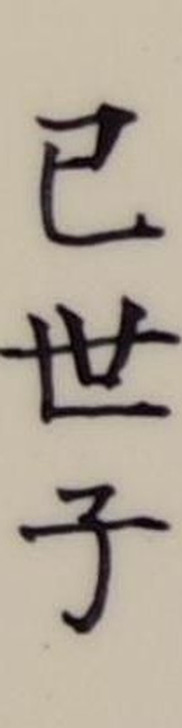已世子
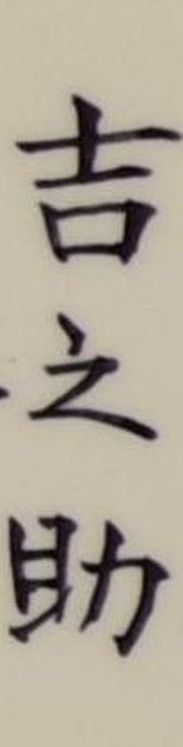吉之助
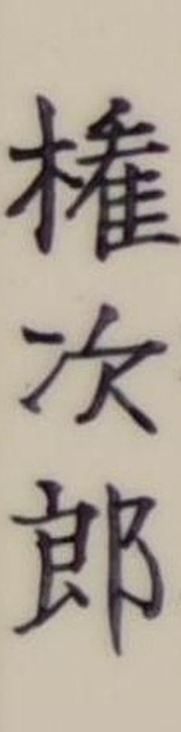権次郎

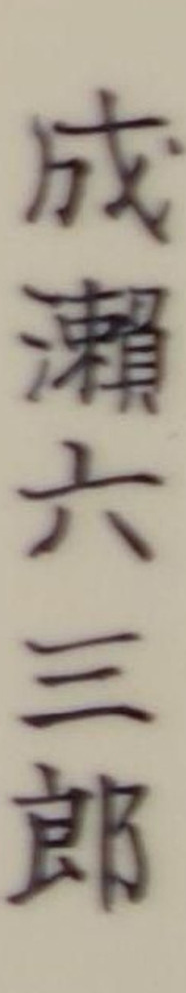成瀬六三郎
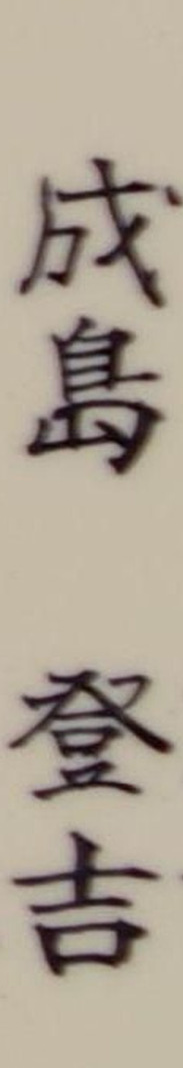成島登吉
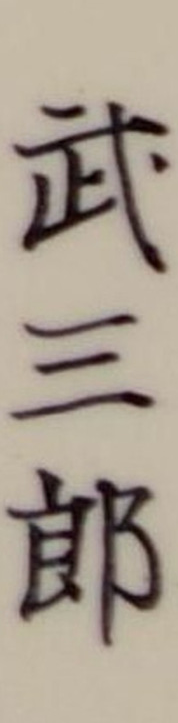武三郎
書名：M~S
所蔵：高野山金剛峯寺
